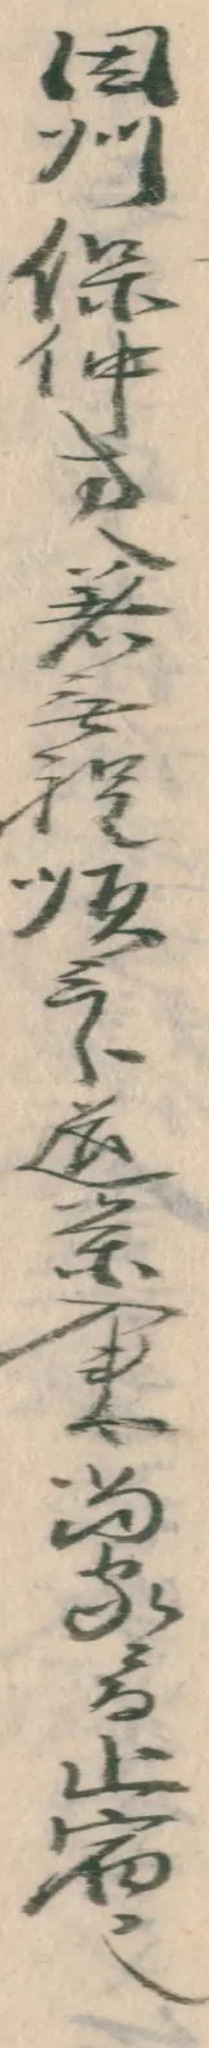因州保仲方へ着無程順三郎道栄入来當家に而止宿也
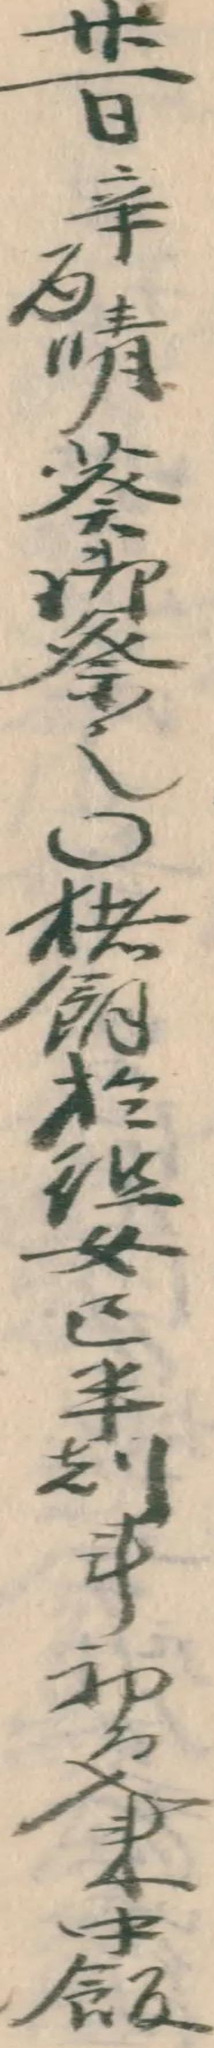廿一日辛卯晴葵御祭也○猪飼於組女巳半刻斗初而入来中飯
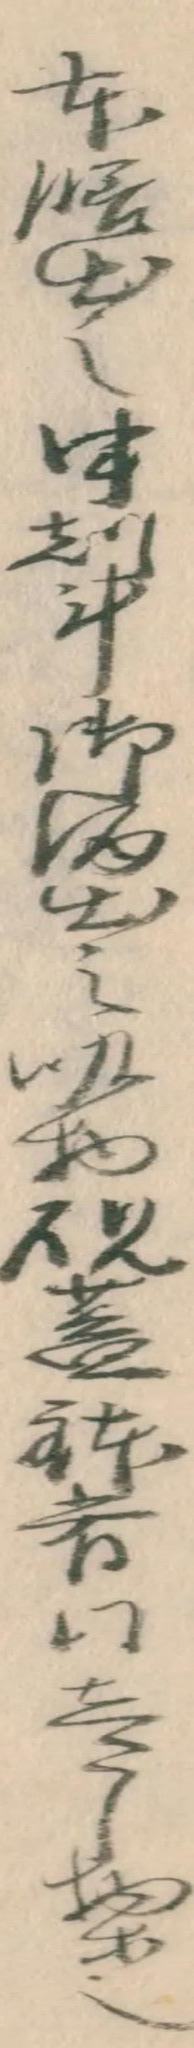本膳出之申刻斗御酒出之吸物硯蓋鉢肴同ひたし物等也
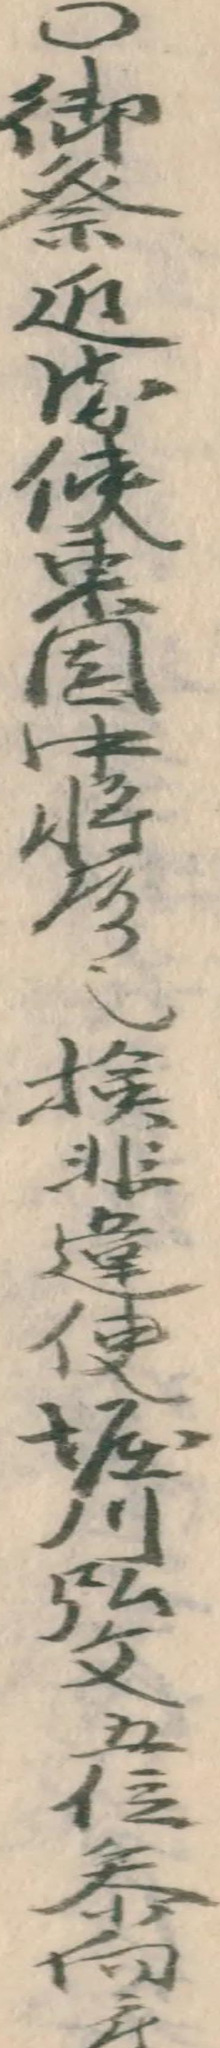○御祭近衛使東国中将殿也検非違使堀川弘文五位参向ニ付
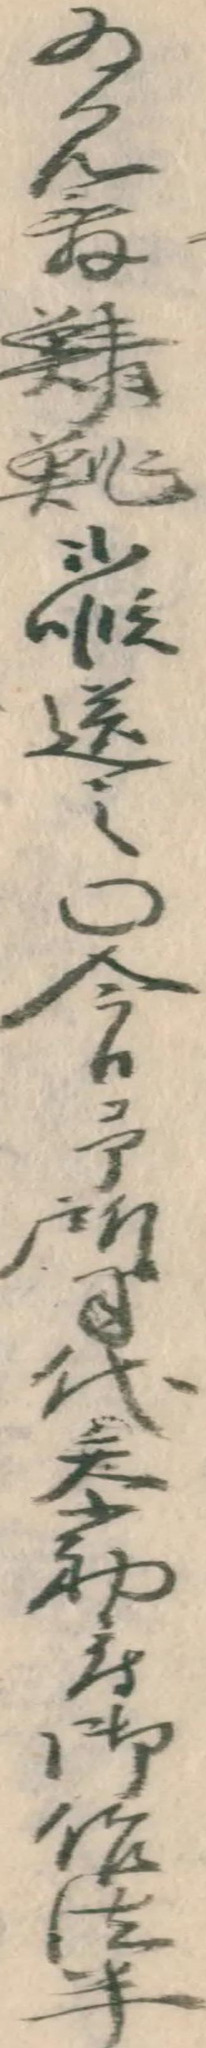為見舞鯖鰩二喉送之○今日予所司代参勤ニ付御作法半
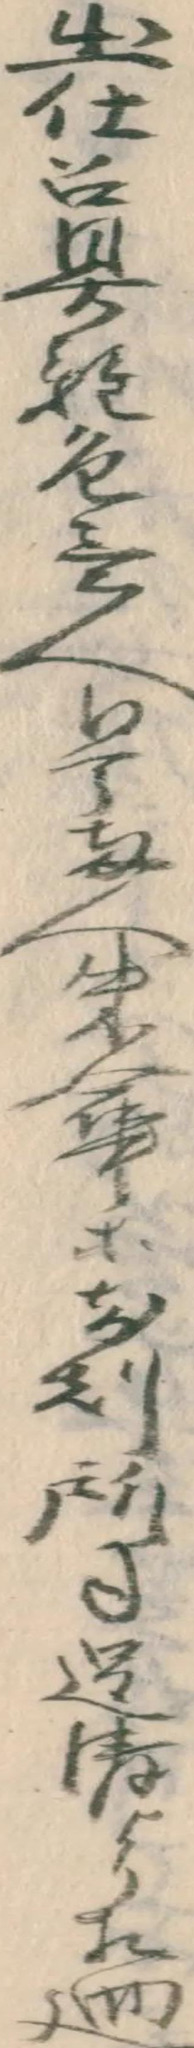出仕召具雑具壱人白庁両人朱傘等両刻所司逞清より相廻
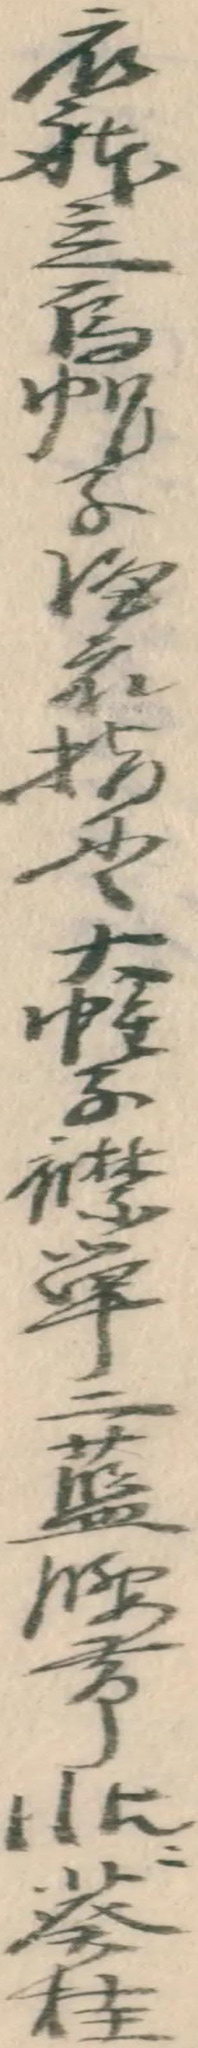衣体立烏帽子浄衣指貫大帷子襟単二藍腰帯之帖ニ葵桂
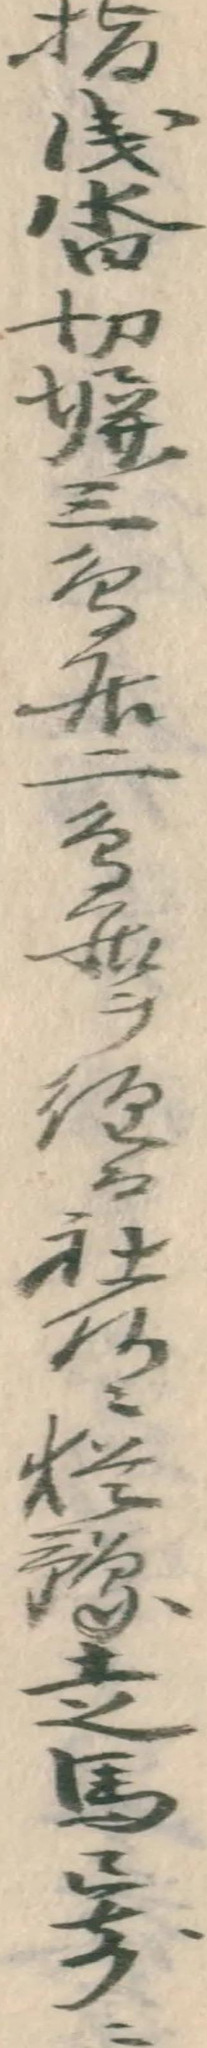指浅沓切塀三鳥居二鳥居ヲ経而社頭ニ猶豫走馬已前ニ
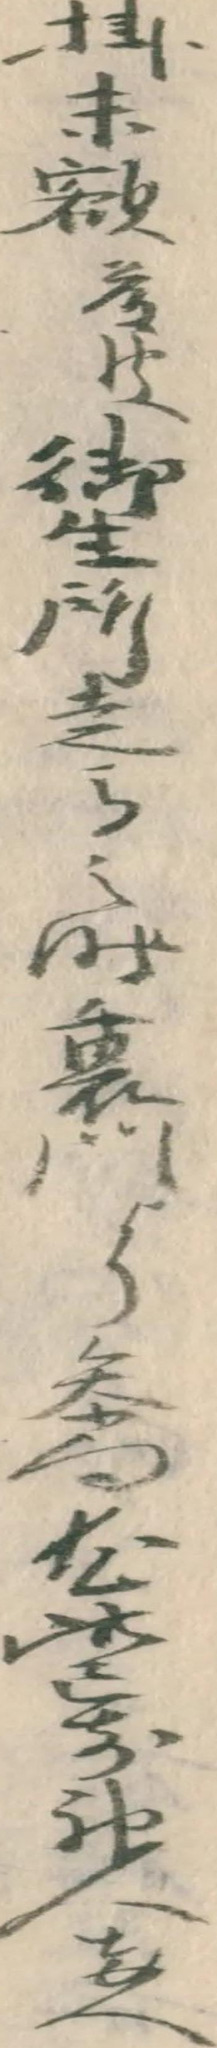掛末額藤皮御生所走馬之時裏門より参向尤此已前神人両人
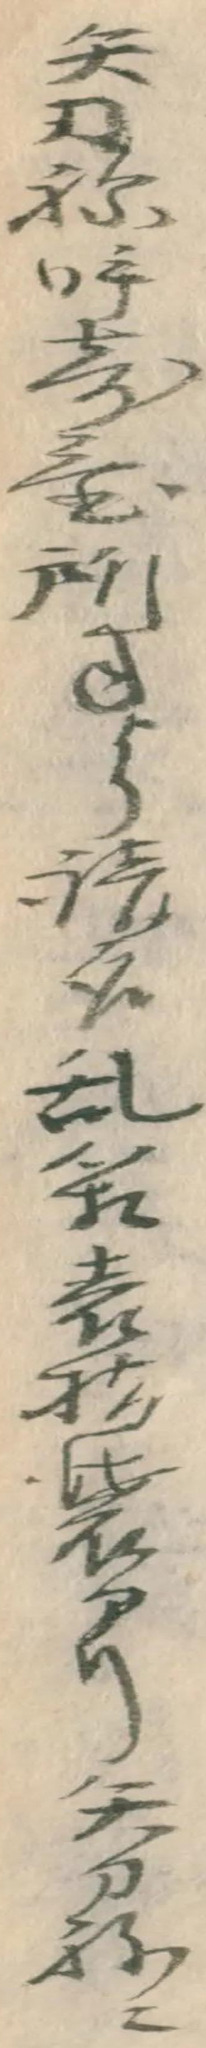矢刀祢呼寄置所司より請取乱箱表指袋部引矢刀祢ニ

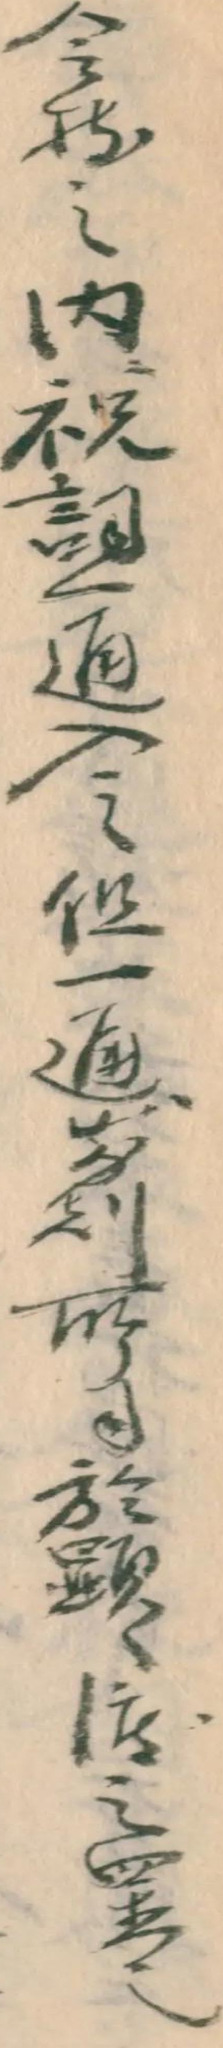令持之内ニ祝詞一通入之但一通前刻所司於顕へ渡之置也
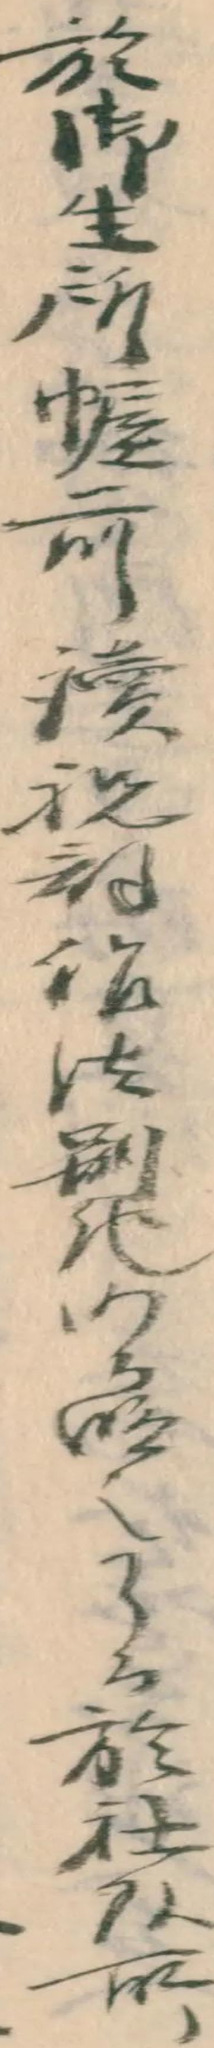於御生所幄前讀祝詞作法別記仍而略之了而於社頭所
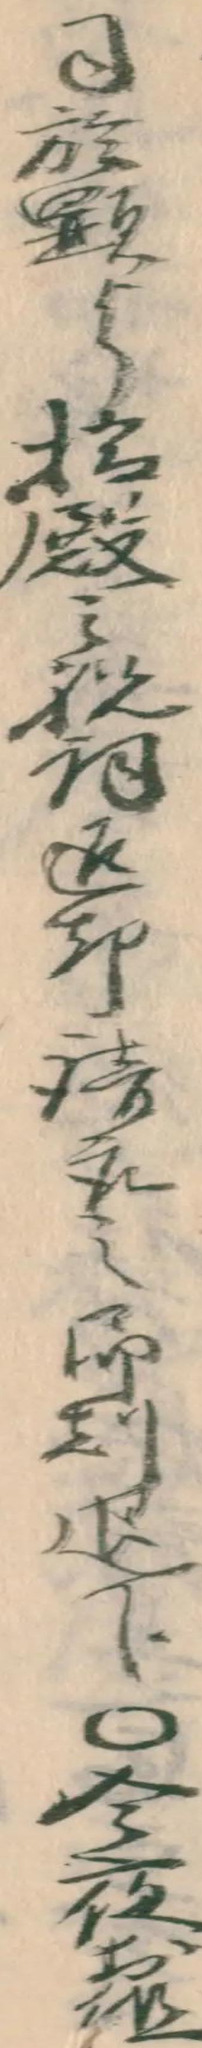司於頭より橋殿之祝詞返却請取之節刻退下○今夜於組
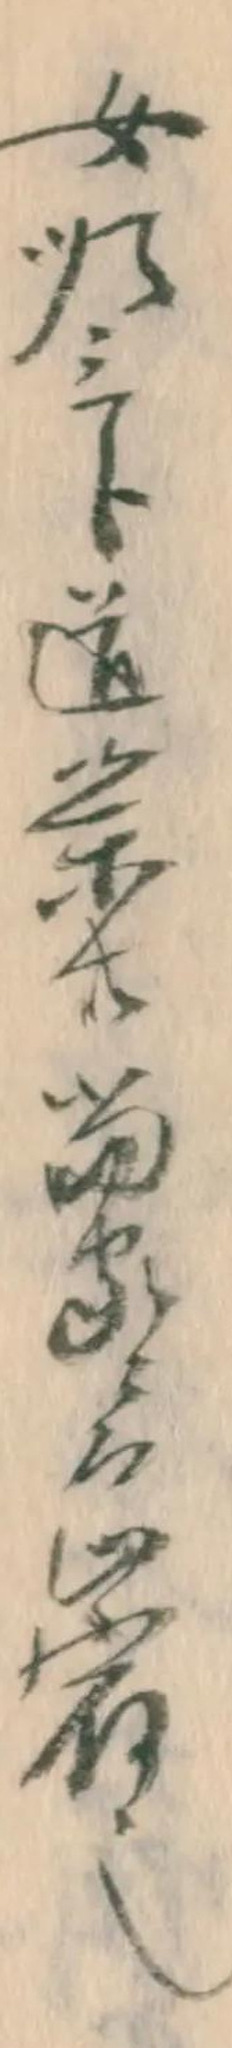女順三郎道栄共當家ニ而止宿也
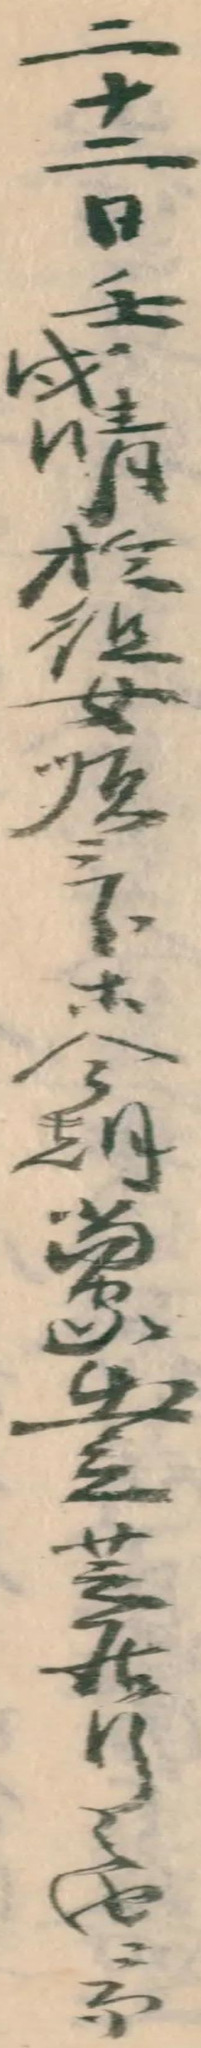二十二日壬戌晴於組女順三郎等今朝當家出立芝居行之由ニ而
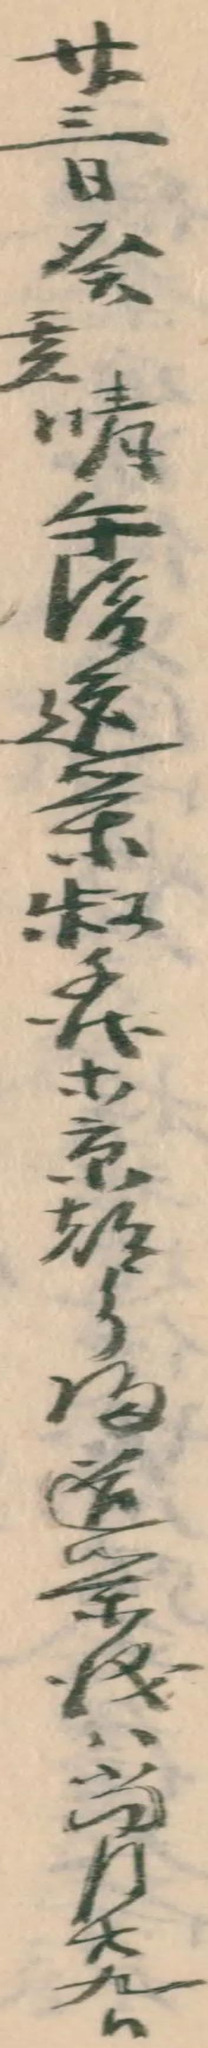廿三日癸亥晴午後道栄叔千代等京都より帰道栄儀ハ當月廿九日
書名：賀茂社記録. 第66冊
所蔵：国立国会図書館 National Diet Library, JAPAN
